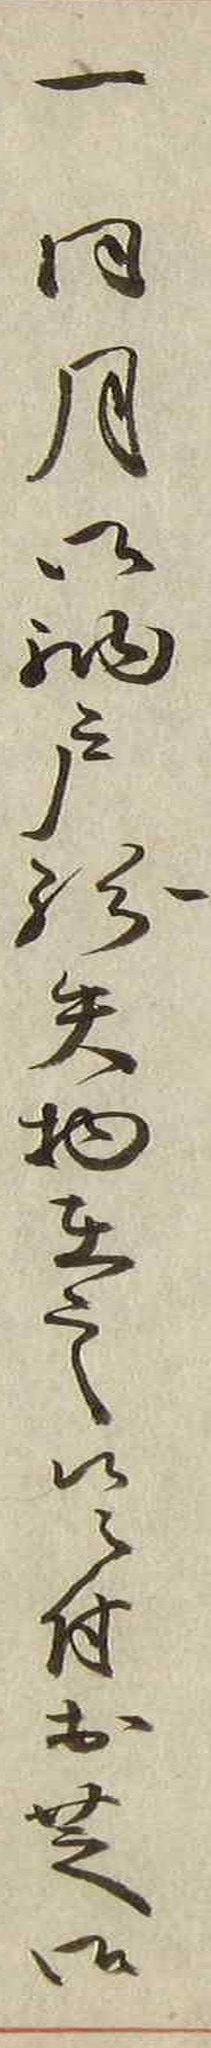一同月御納戸給失物在之候ニ付於芝御

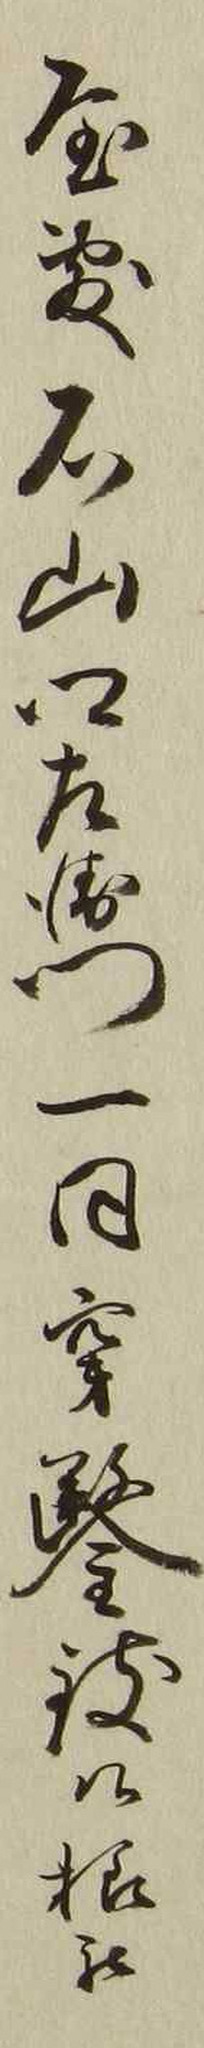屋敷石山郷左衛門一同穿鑿致候様被
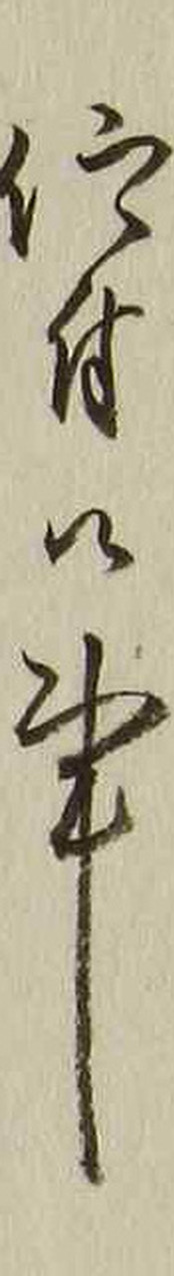仰付候事
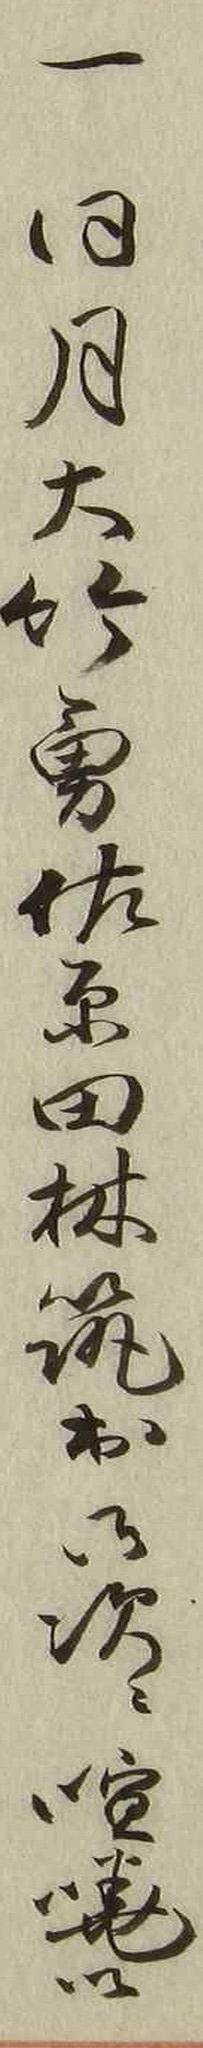一同月大竹勇佐原田林筑於御次ニ喧嘩い
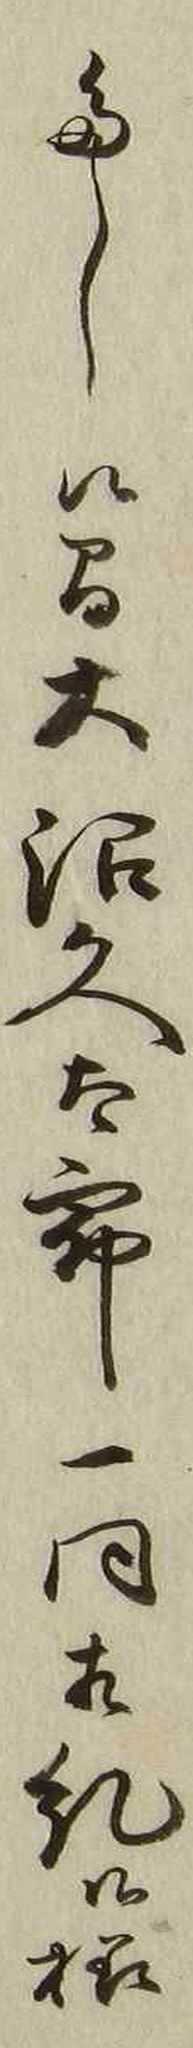たし候間大沼久太郎一同相糺候様
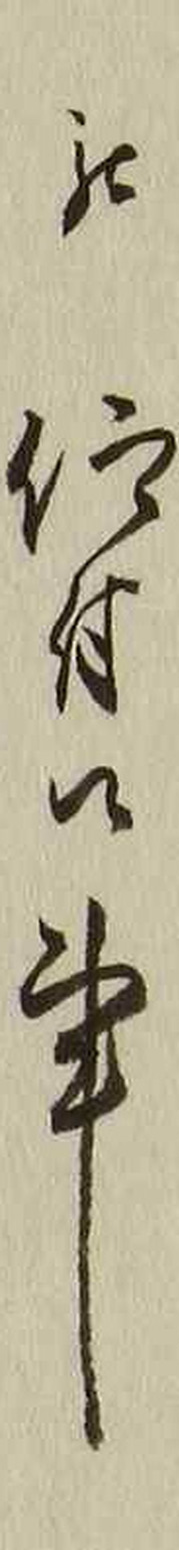被仰付候事
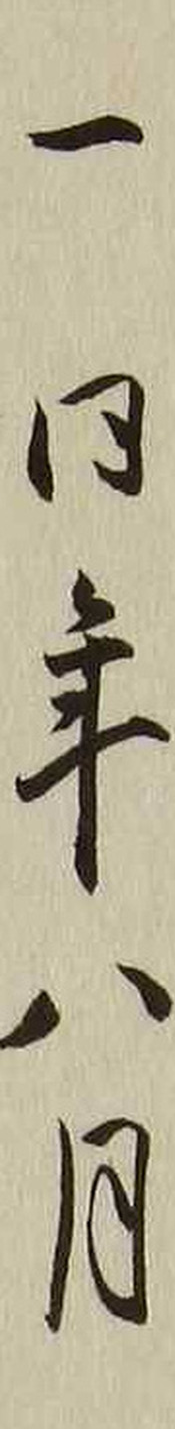一同年八月
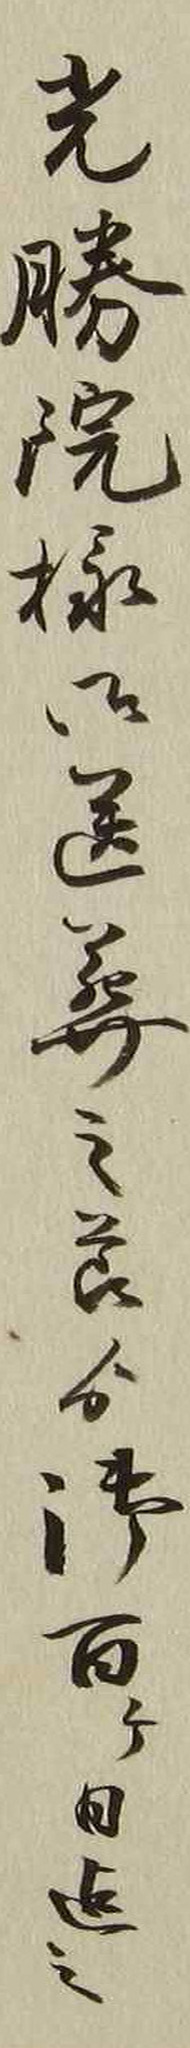光勝院様御送葬之節ゟ御百ケ日迄之
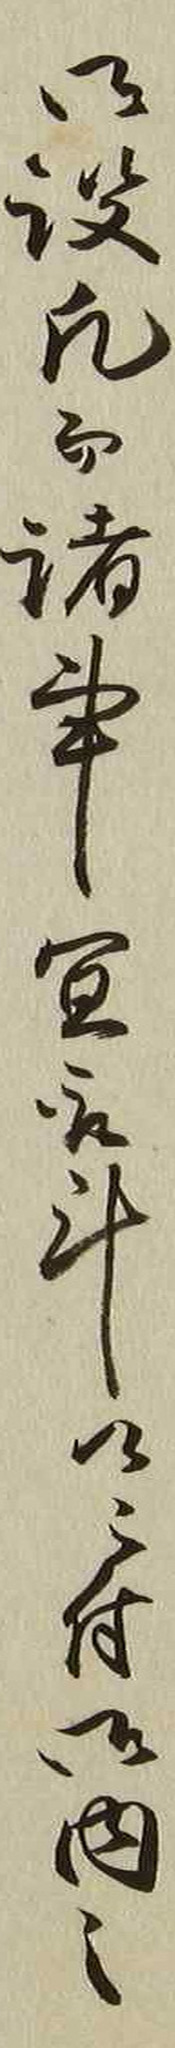御役凡而諸事宜取計候ニ付御内々
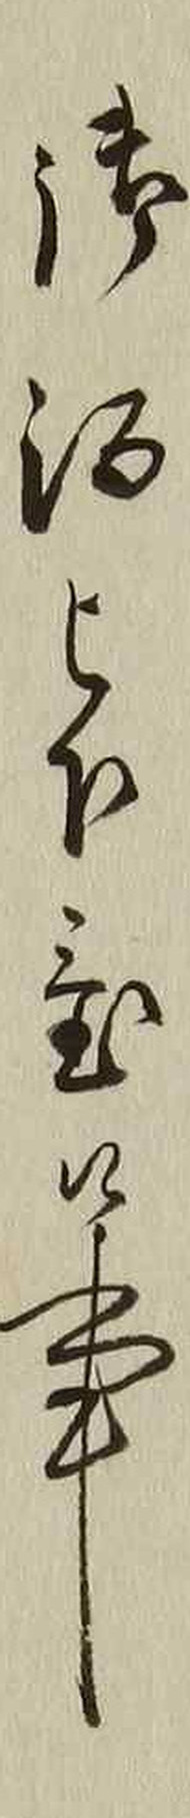御酒被下置候事
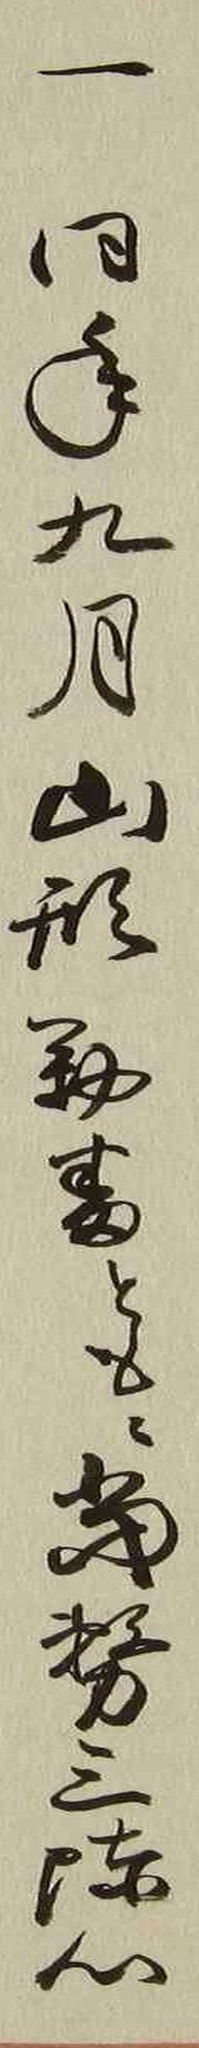一同年九月山形勤番ともニ当務三陣心
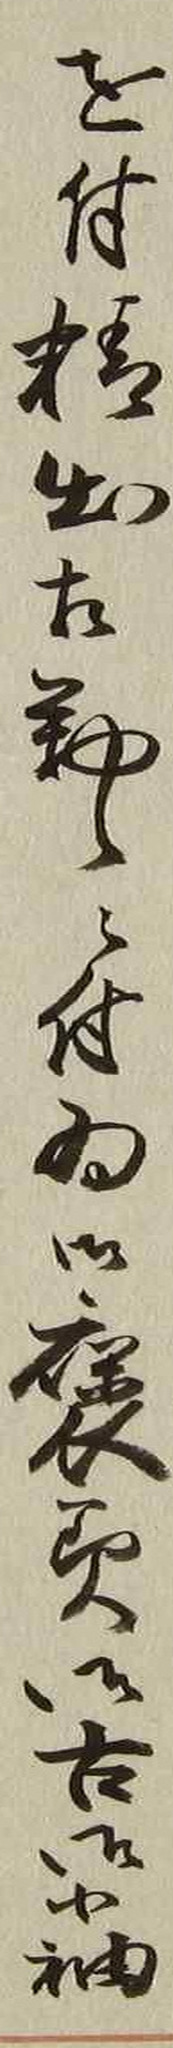を付精出相勤候ニ付為御褒美御古御御小袖
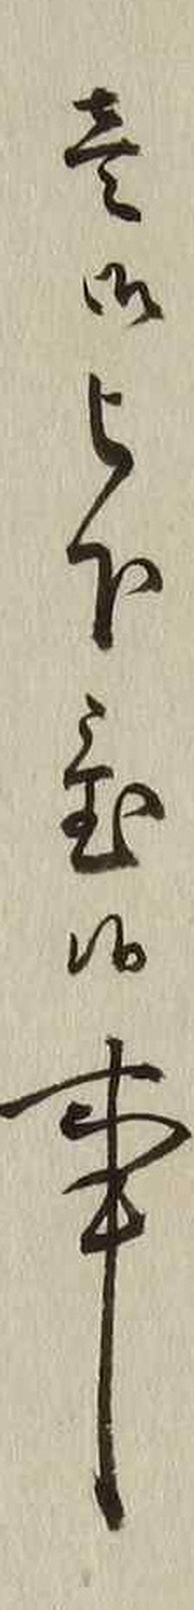壱御被下置候事
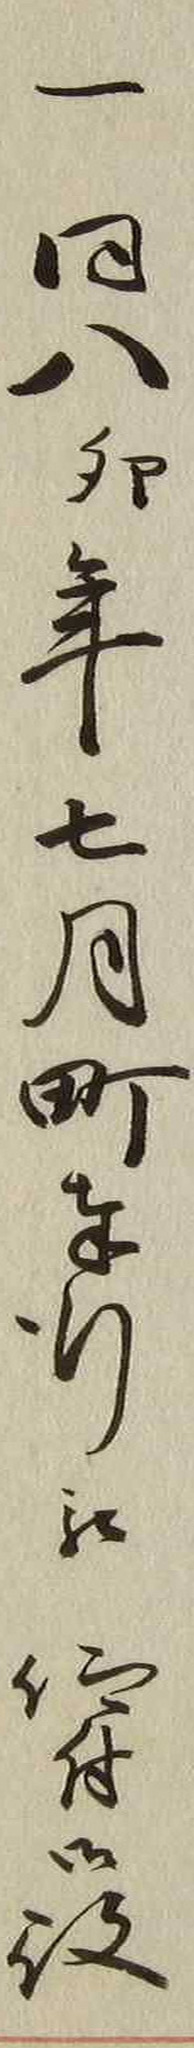一同八卯年七月町奉行被仰付御役
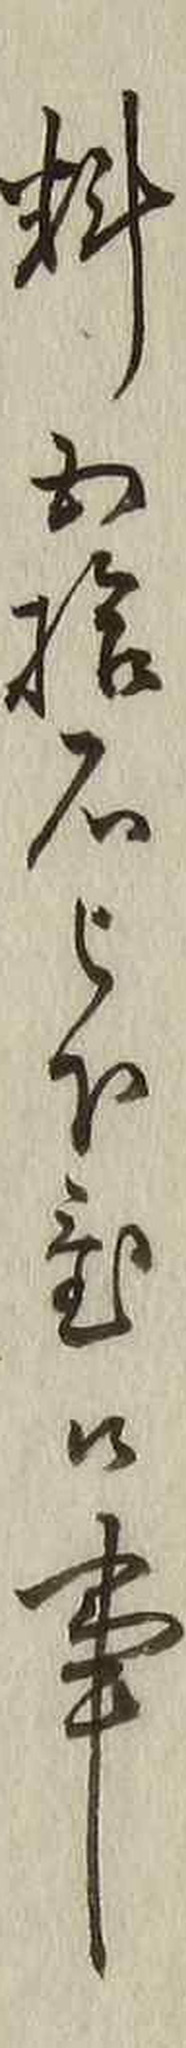料五拾石被下置候事
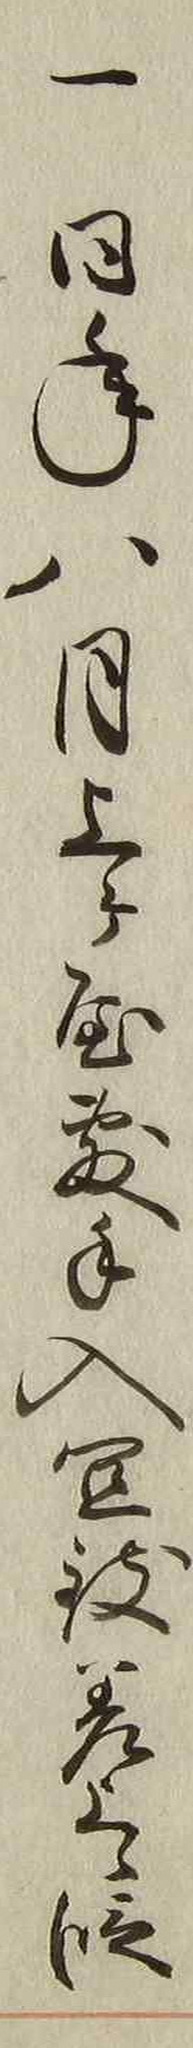一同年八月上ケ屋敷手入宜致差上候段
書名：諸士系譜　巻之15　い之部15
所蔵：会津若松市立会津図書館
